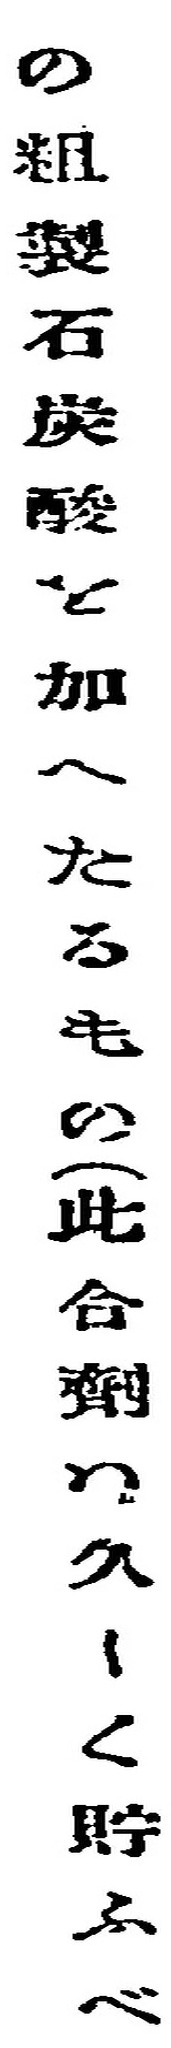の粗製石炭酸を加へたるもの(此合剤は久しく貯ふべ
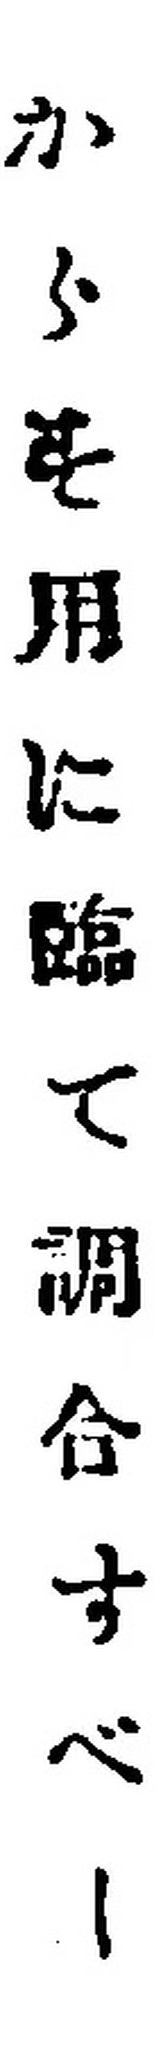からす用に臨て調合すべし
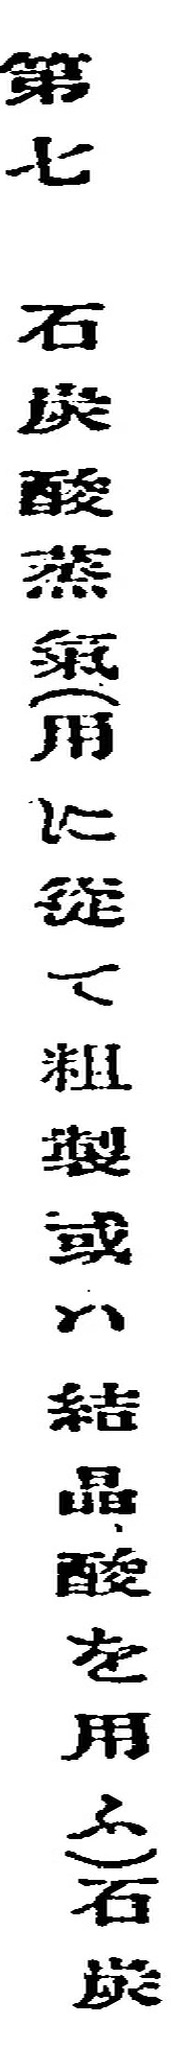第七石炭酸蒸気(用に従て粗製或は結晶酸を用ふ)石炭
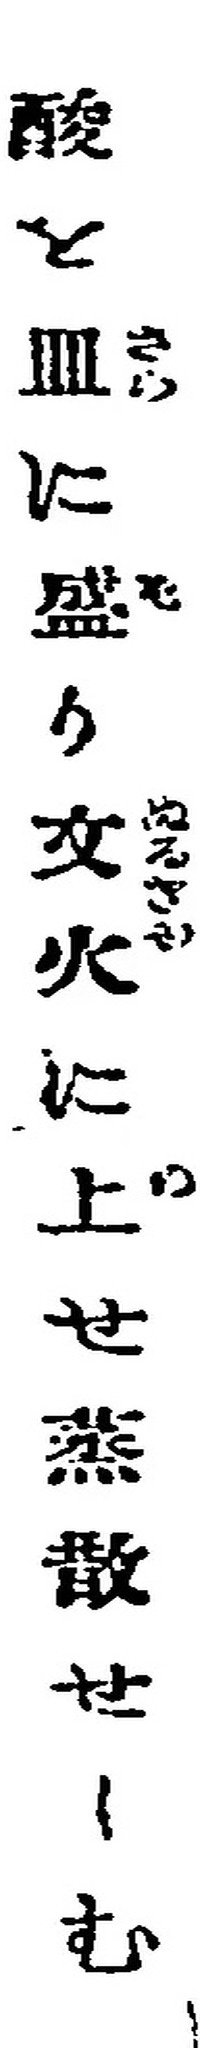酸を皿に盛り文火に上せ蒸散せしむ
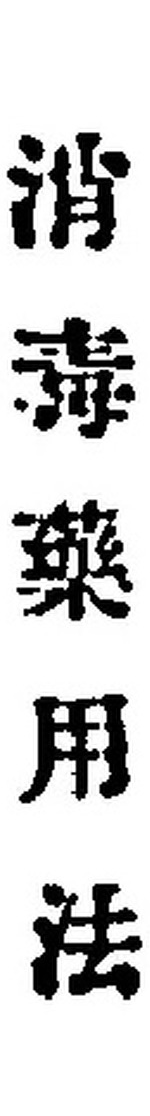消毒薬用法
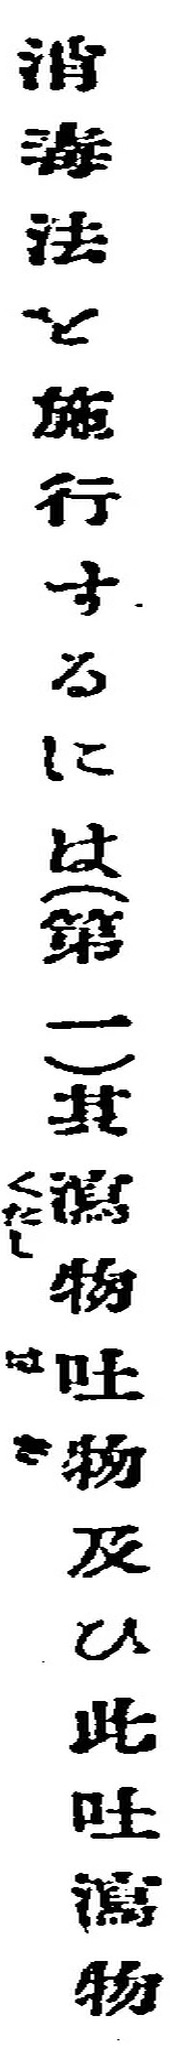消毒法と施行するには(第一)其瀉物吐物及ひ此吐瀉物
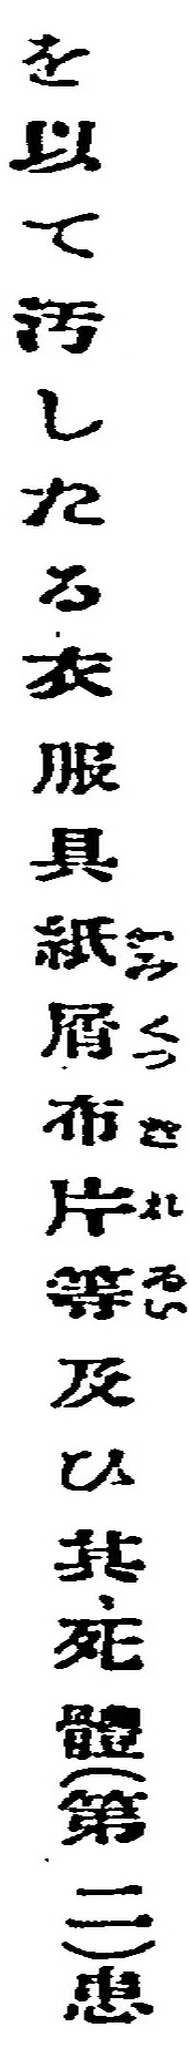を以て汚したる衣服具紙屑布片等及ひ其死体(第二)患
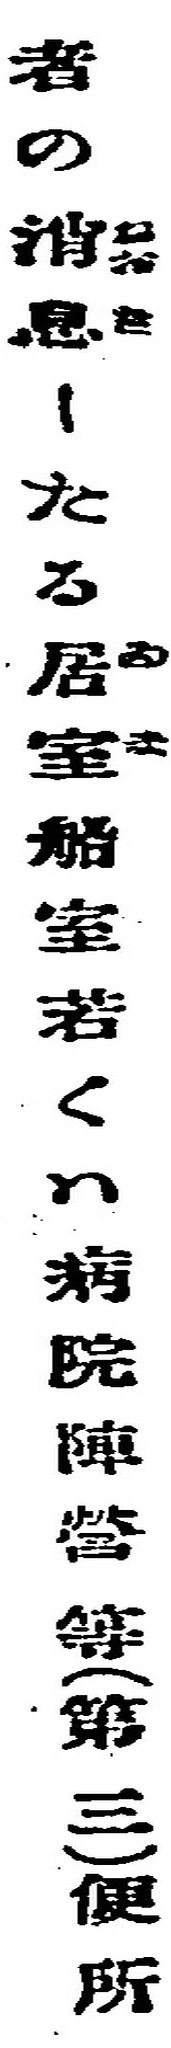者の消息したる居室船室若くは病院陣営等(第三)便所
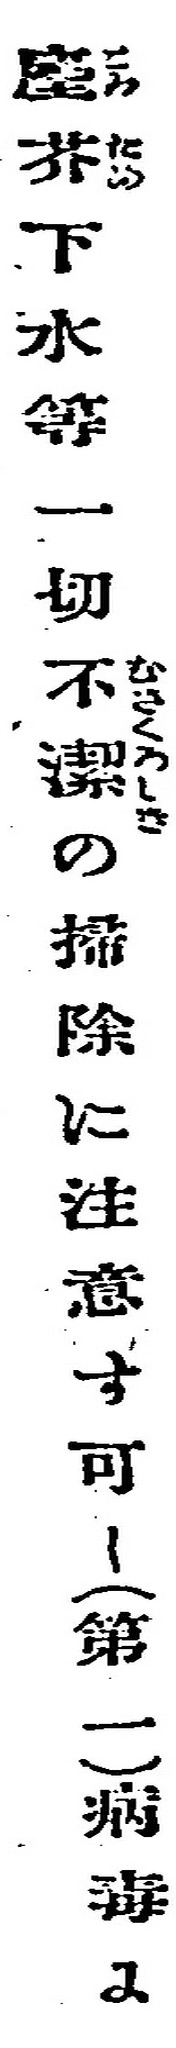塵芥下水等一切不潔の掃除に注意す可し(第一)病毒に
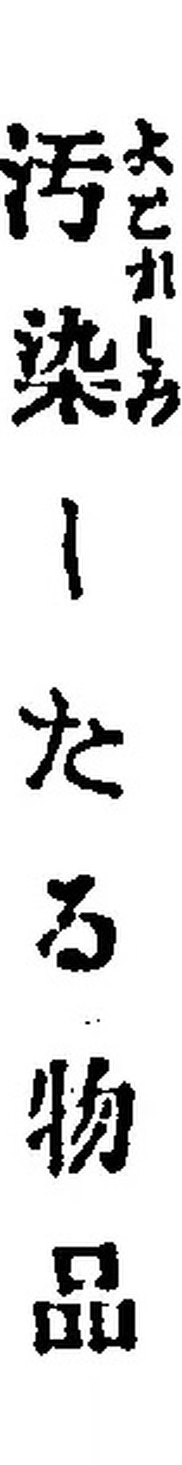汚染したる物品
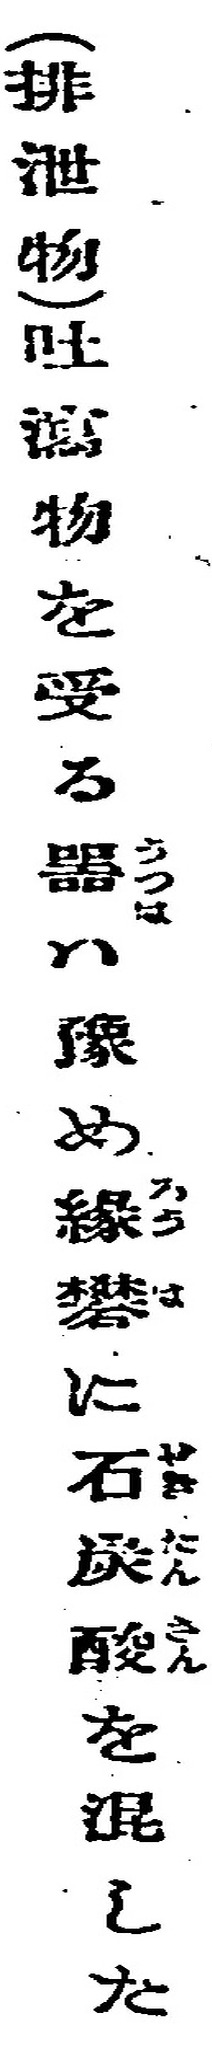(排泄物)吐瀉物を受る器は予め縁礬に石炭酸を混した
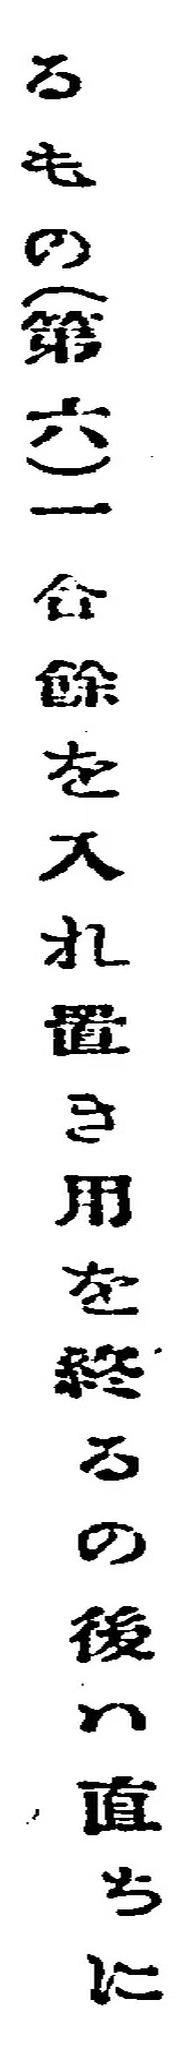るもの(第六)一合余を入れ置き用を終るの後は直ちに
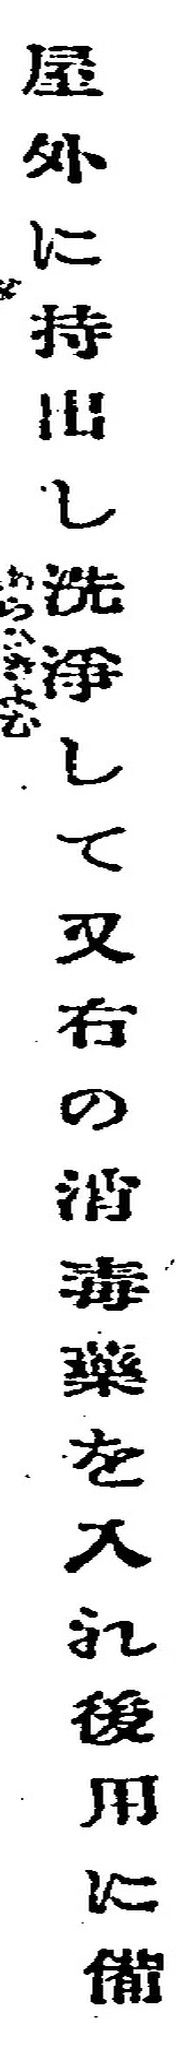屋外に持出し洗浄して又右の消毒薬を入れ後用に備
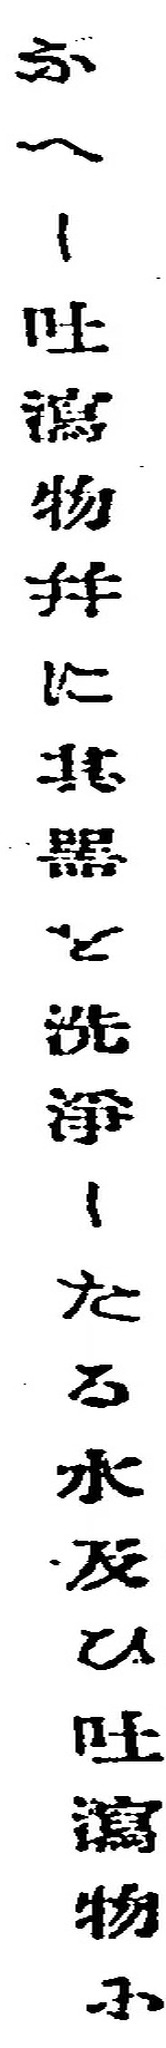ふへし吐瀉物并に其器を洗浄したる水及ひ吐瀉物に
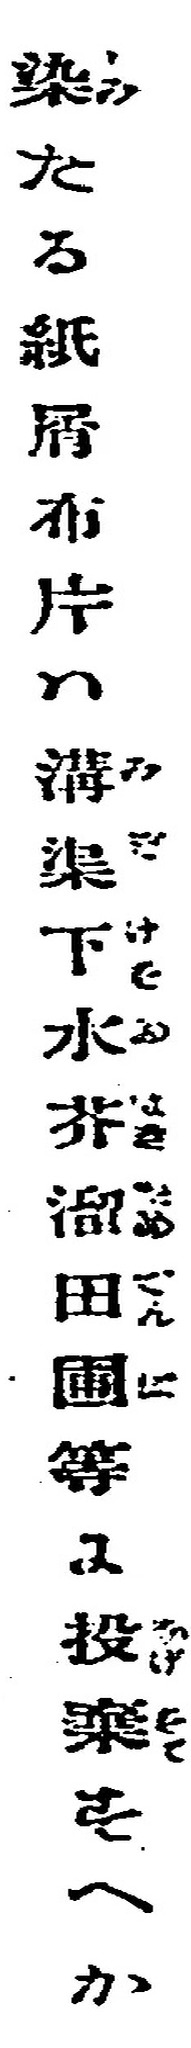染たる紙屑布片は溝渠下水芥溜田圃等に投棄すへか
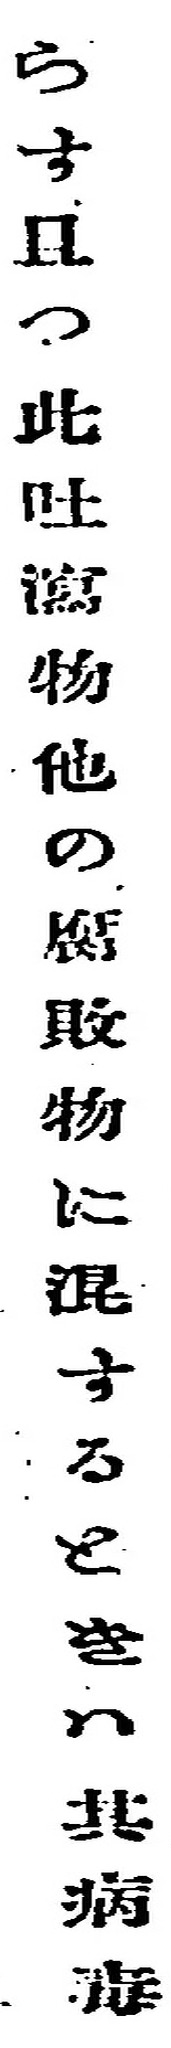らす且つ此吐瀉物他の腐敗物に混するときは其病毒
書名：これら病予防心得
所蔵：国立国会図書館 National Diet Library, JAPAN
